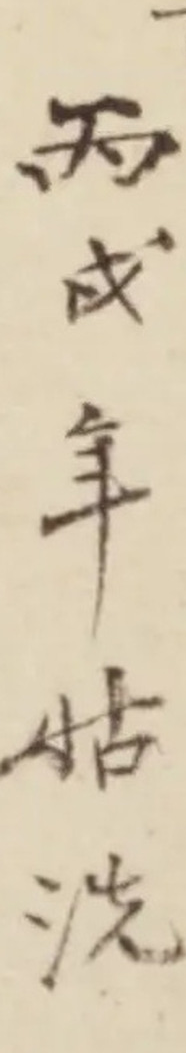丙戌年姑洗
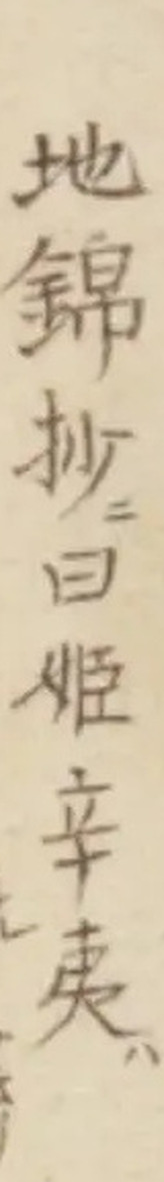地錦抄ニ曰姫辛夷ハ
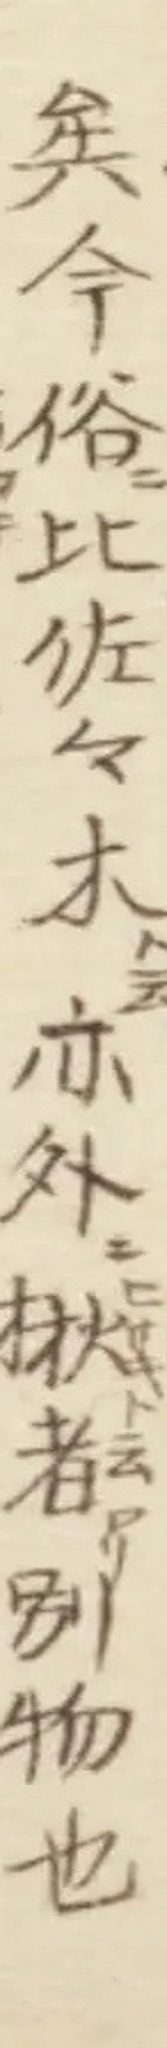矣今俗ニ比佐々木ト云亦外ニ楸ト云者アリ別物也
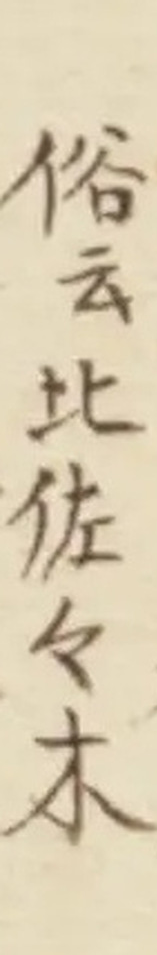俗云比佐々木
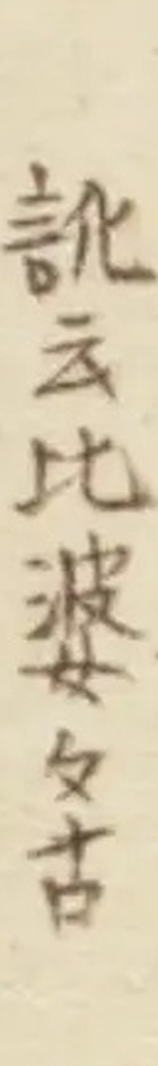訛云比婆々古
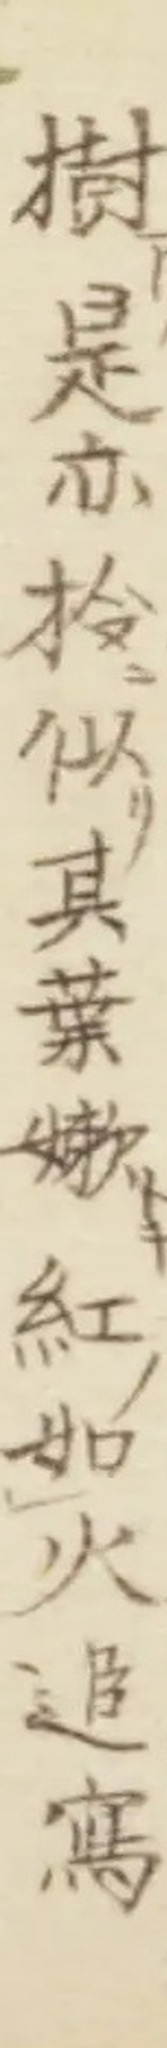樹アリ是亦柃ニ似リ其葉嫩リトキ紅ノ如火追寫
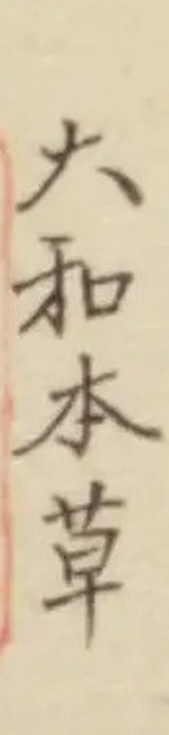大和本草

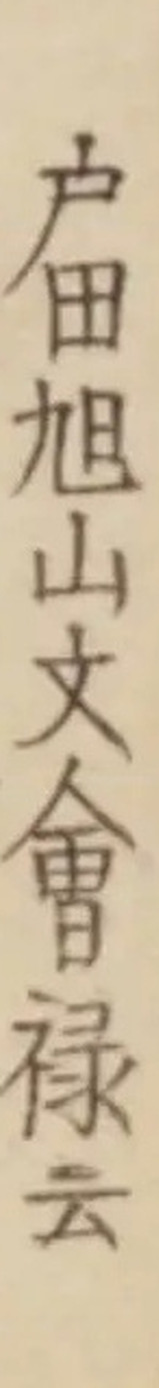戸田朝日山文會禄云
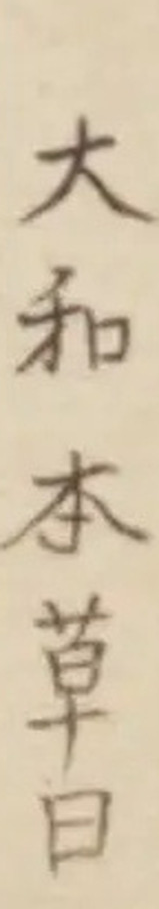大和本草曰
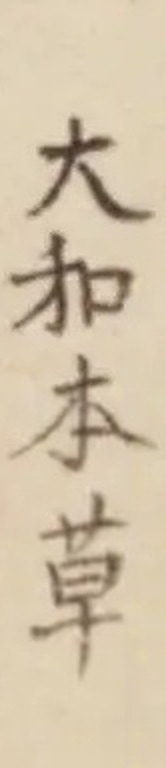大和本草
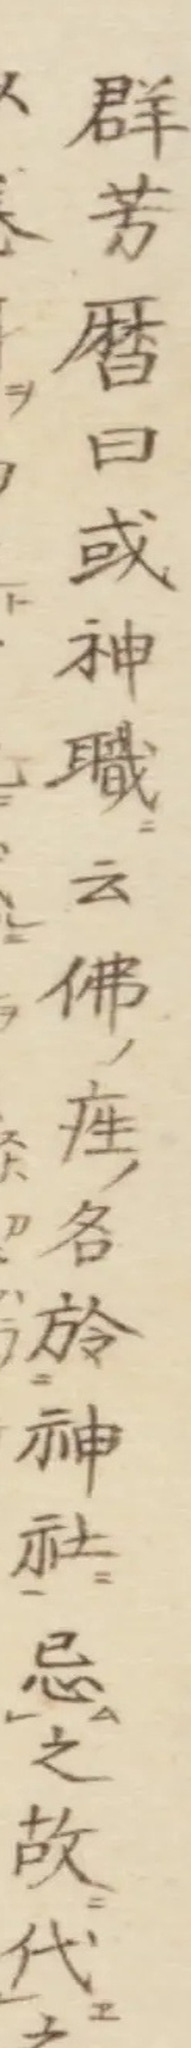群芳暦曰或神職ニ云佛ノ座ノ名於神社ニ忌ム之故ニ代エ
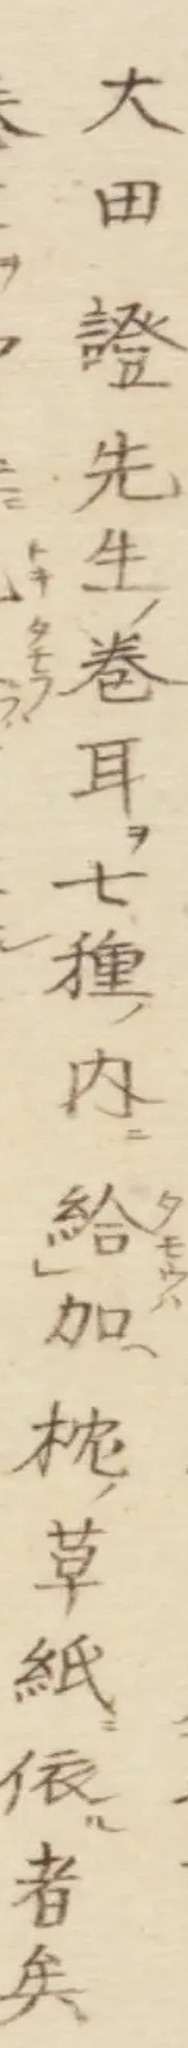大田證先生ノ巻耳ヲ七種ノ内ニ給ウハ加ヘ枕ノ草紙ニ依ル者矣
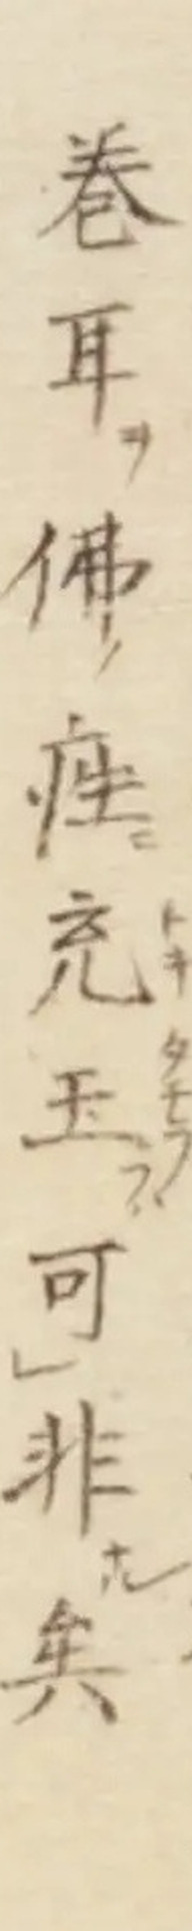巻耳ヲ佛ノ座ニ充玉フ可非ナル矣
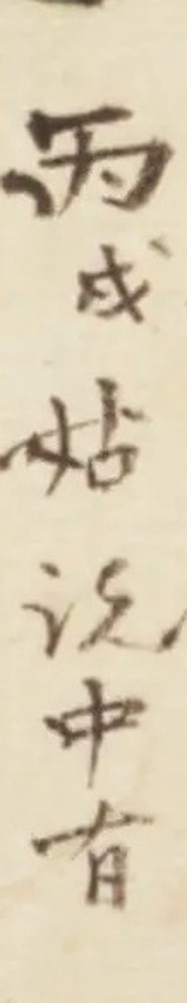丙戌姑洗中有
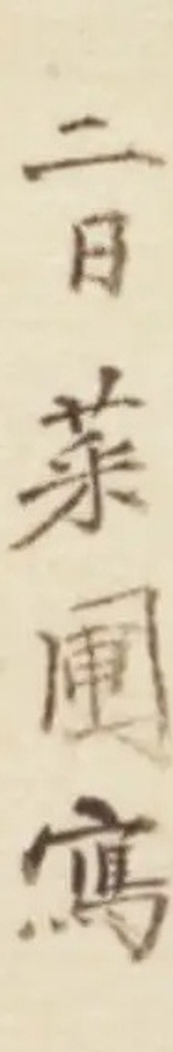二日菜園寫
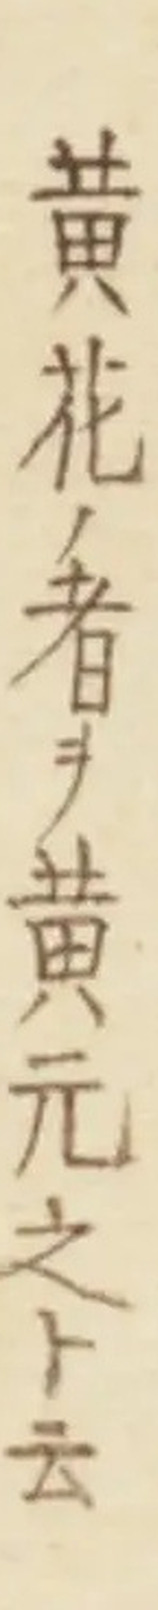黄花ノ者ヲ黄元之ト云
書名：梅園草木花譜春之部. 3
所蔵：国立国会図書館 National Diet Library, JAPAN
